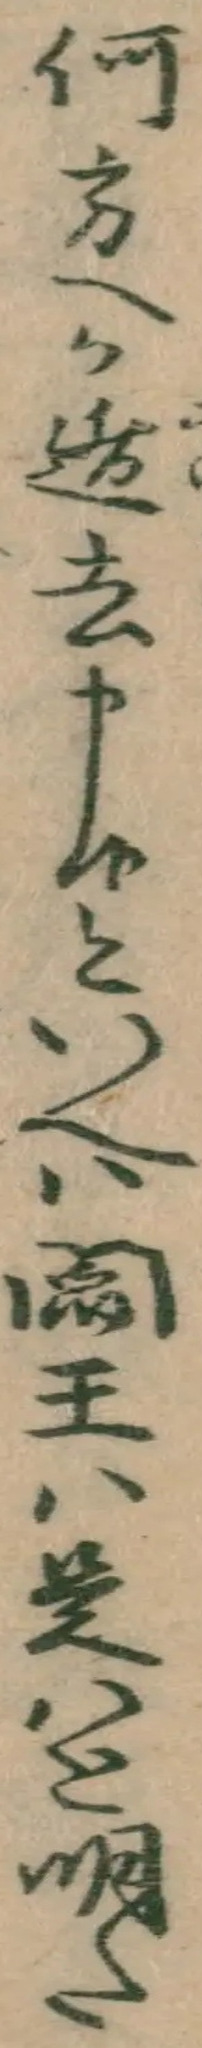何方へか遁去申候といへは閻王は是はと明た
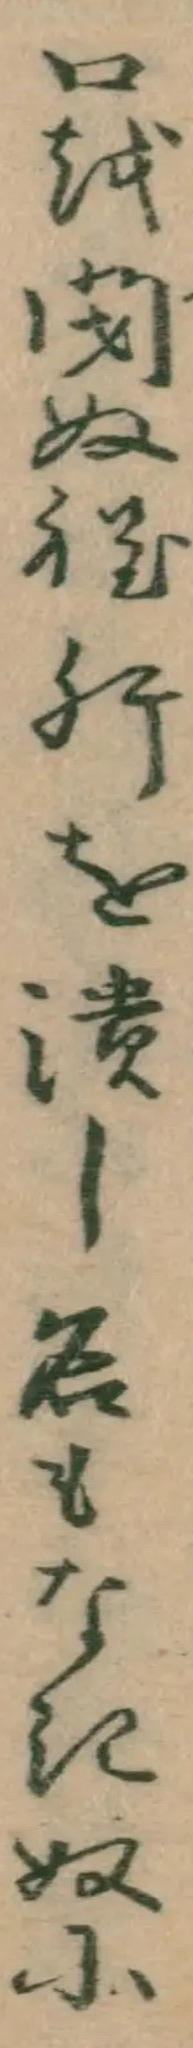口を閉ぬ程肝を潰し名もなき奴に
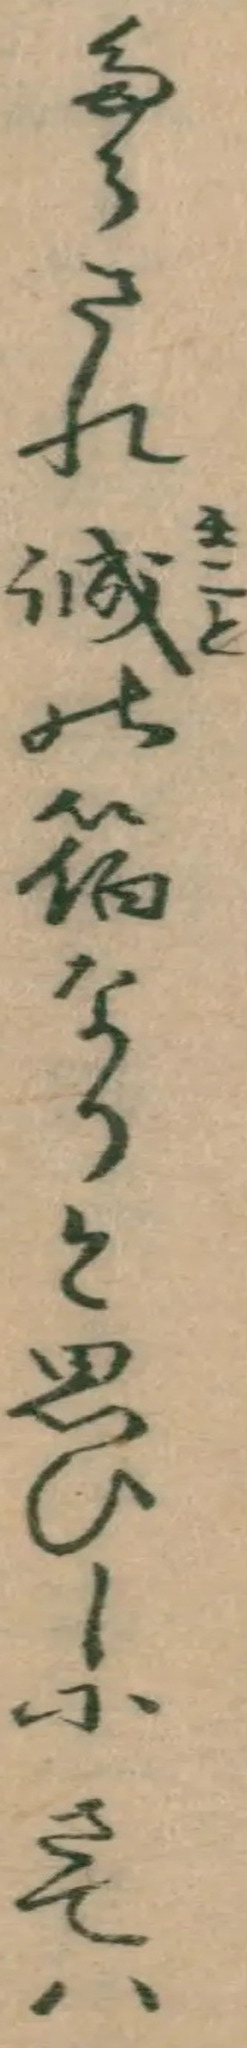たらされ誠の箔なりと思ひしにさては
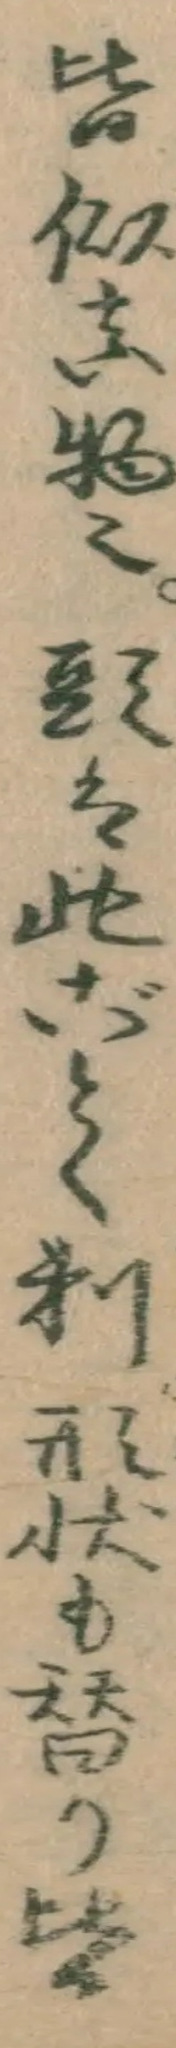皆似真物也。頭は此ごとく剃。形状も替り皆
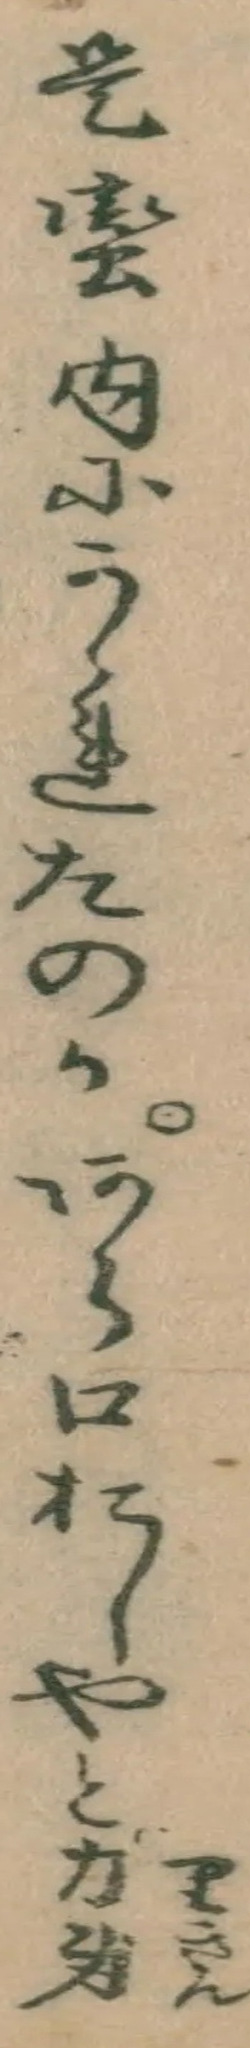是蛮内にかゝれたのか。あら口おしやと力身
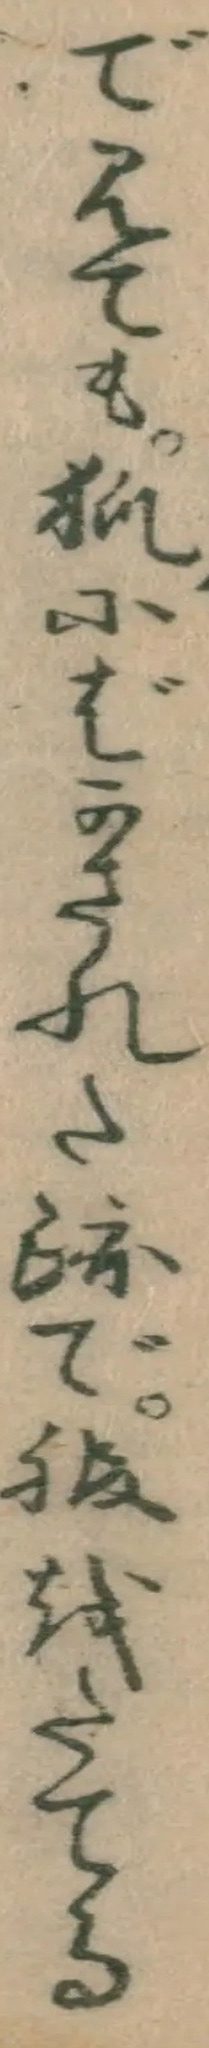でみても。狐にばかされた跡で。腹をたてる
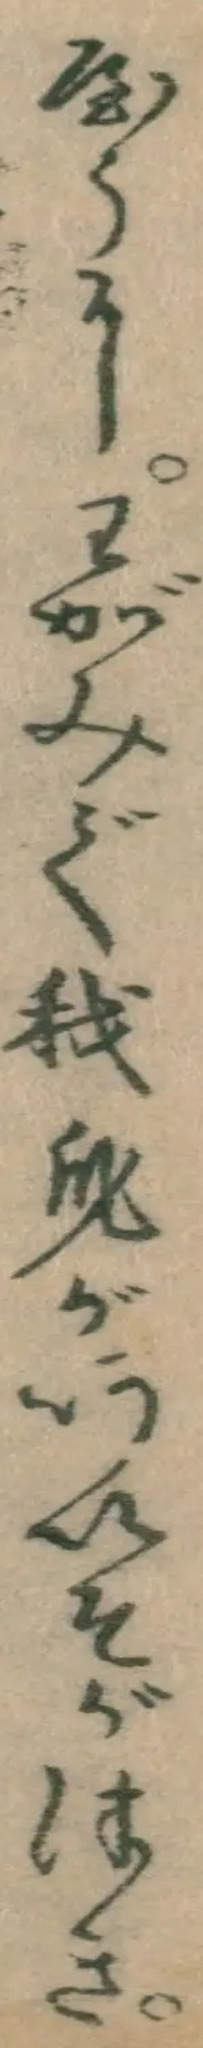やうに。わがみで我身があいそがつき。
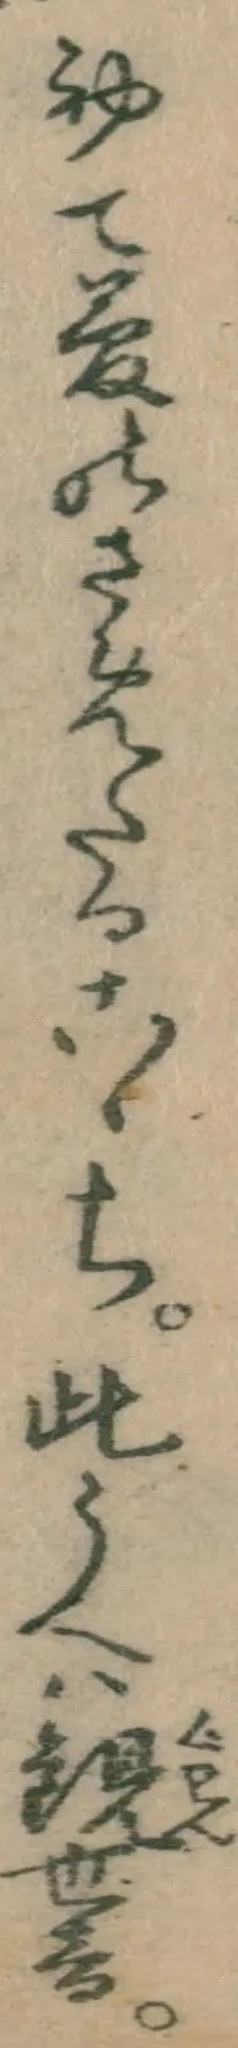初て夢のさめたるこゝち。此うへは観世音。
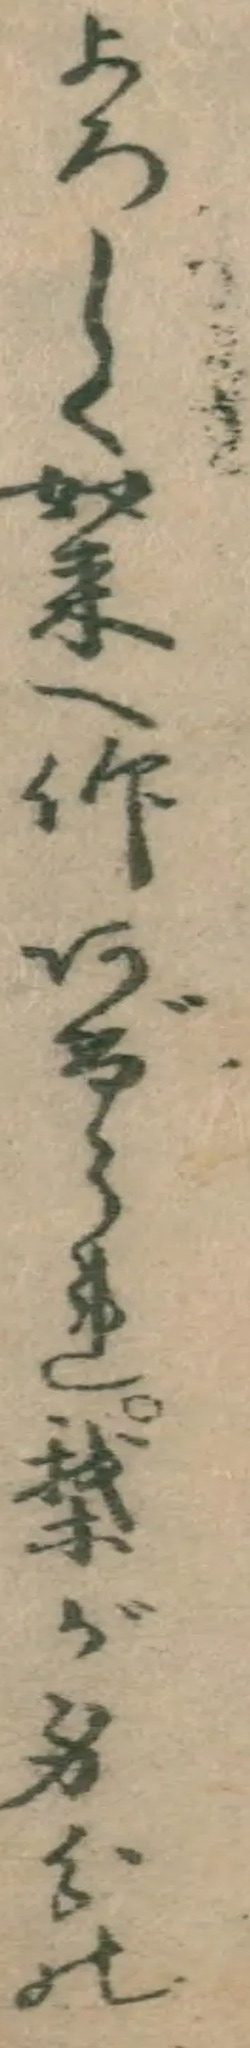よろしく如来へ仰あがられ。我等が身分の
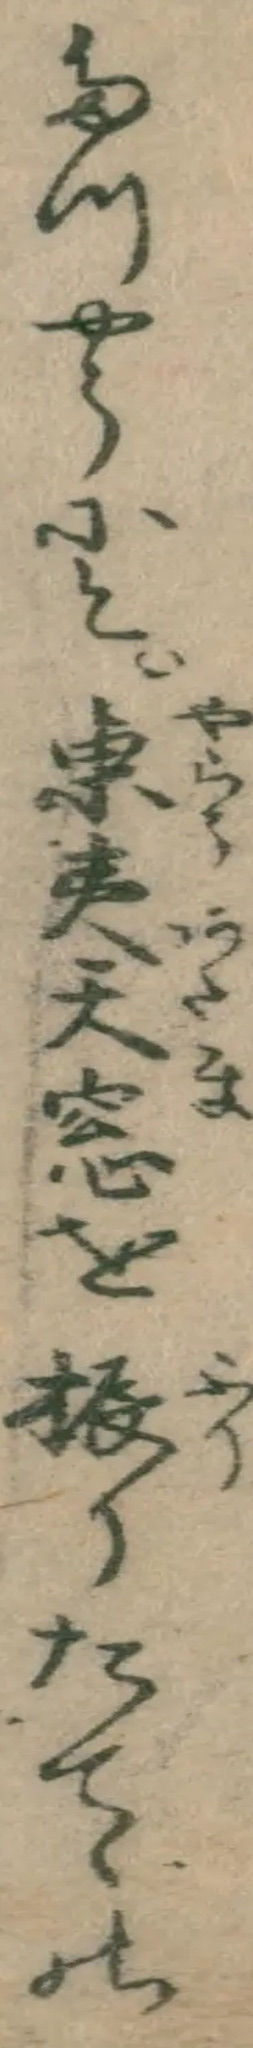たつやうにと。東夷天窓を振りたてゝの
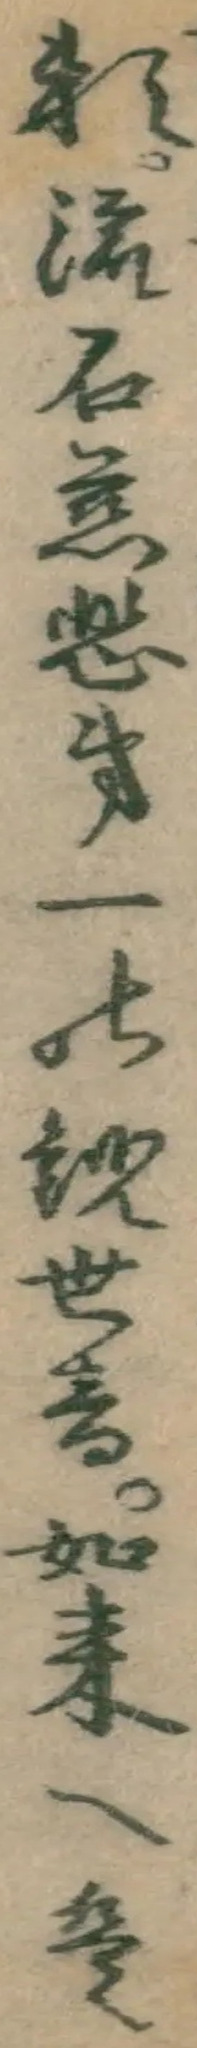頼。流石慈悲第一の観世音。如来へは

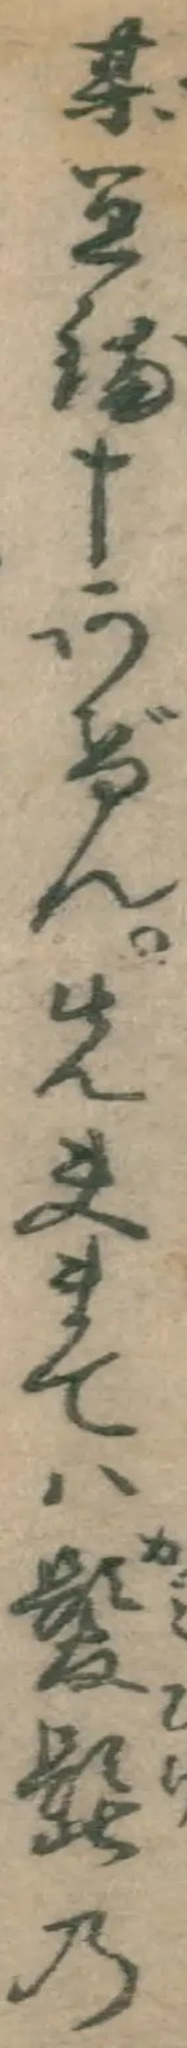某宜鋪申あげん。先夫まては髪髭の
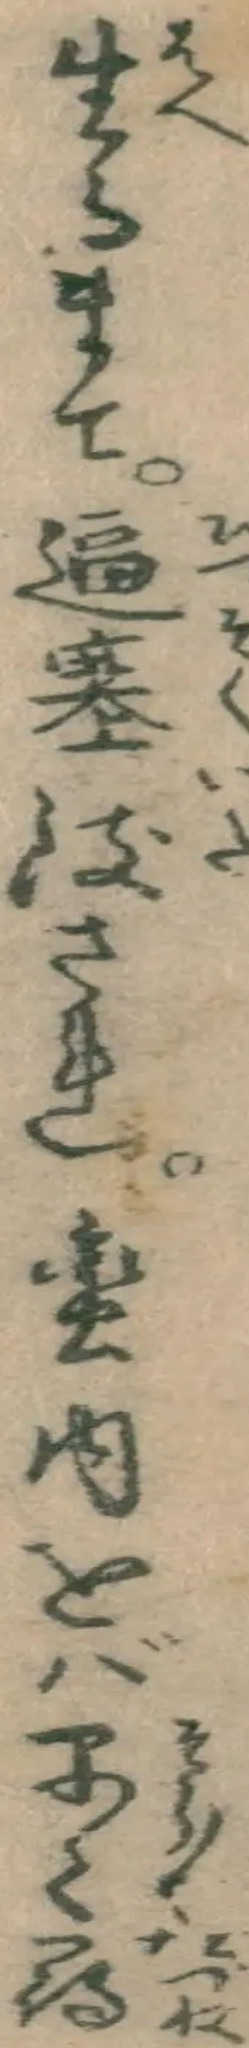生るまて。逼塞致され。蛮内をば早々尋
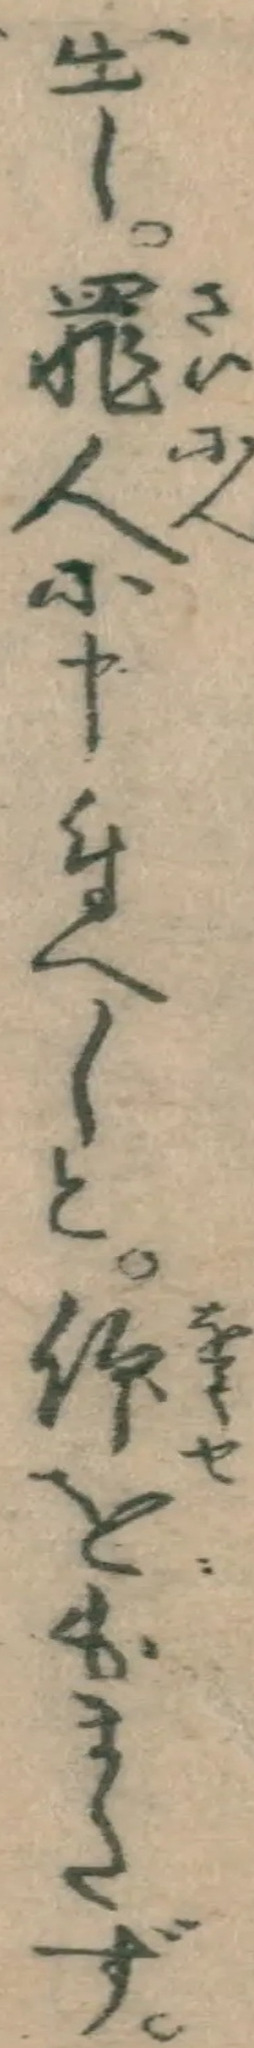出し。罪人に申付へしと。仰をもまたず。
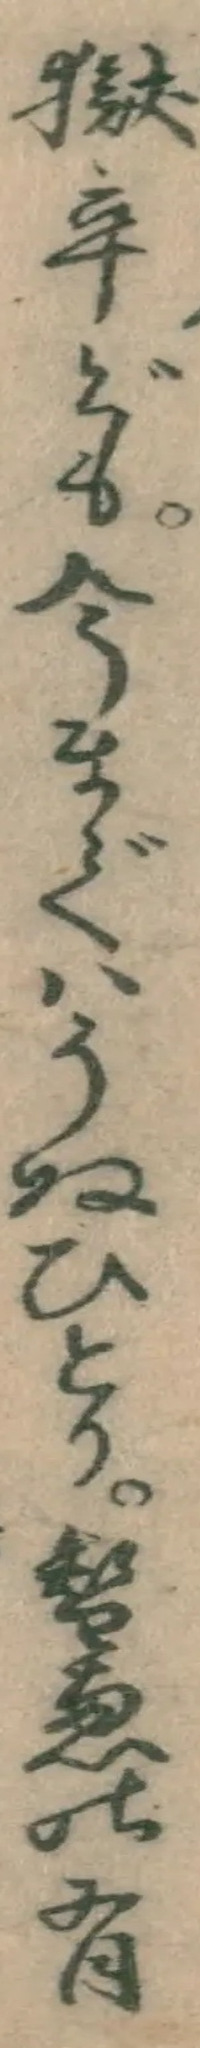獄卒ども。今まではうぬひとり。智恵の有
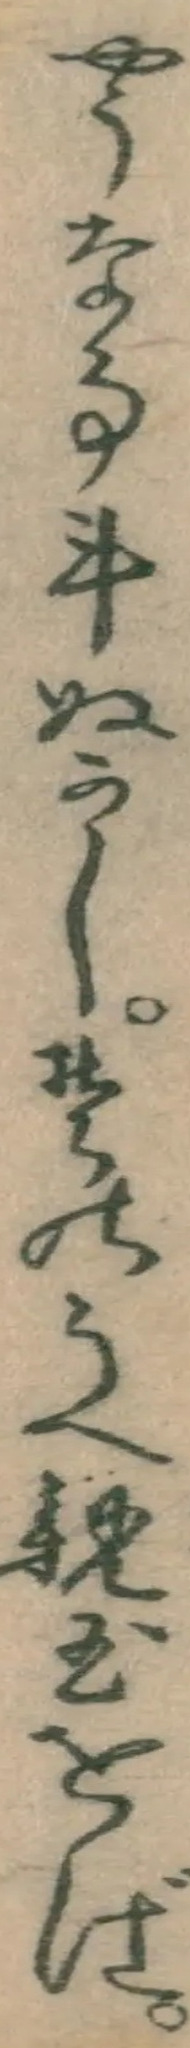やうなこと斗ぬかし。そのうへ親玉をば。
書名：翻草盲目
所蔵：国立国会図書館 National Diet Library, JAPAN
